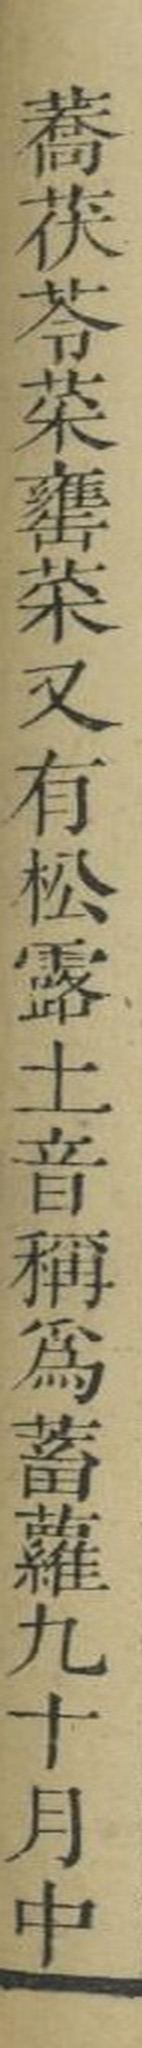蕎茯苓菜罋菜又有松露土音称為蓄蘿九十月中
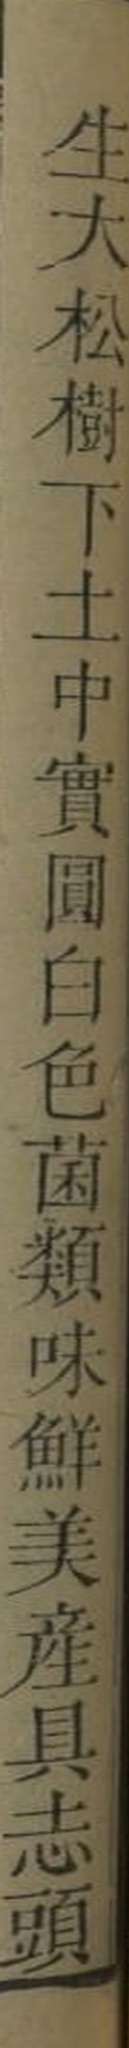生大松樹下土中実円白色菌類味鮮美産具志頭
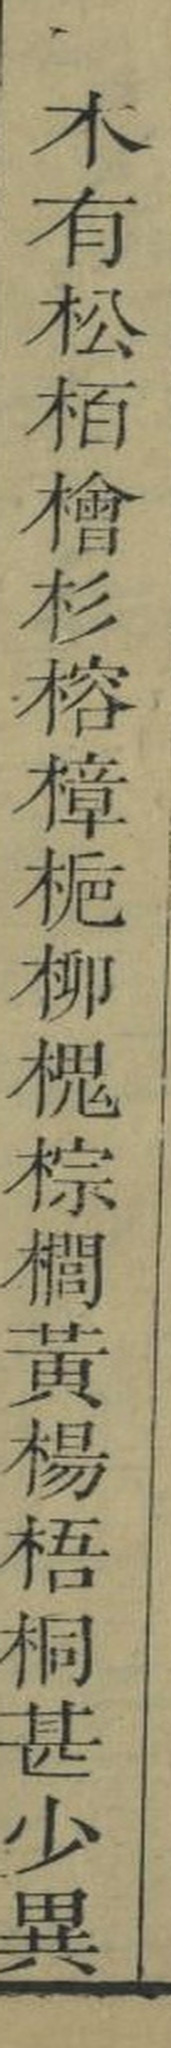木有松栢檜杉榕樟梔柳槐棕櫚黄楊梧桐甚少異
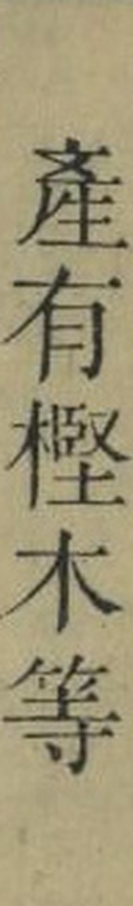産有樫木等
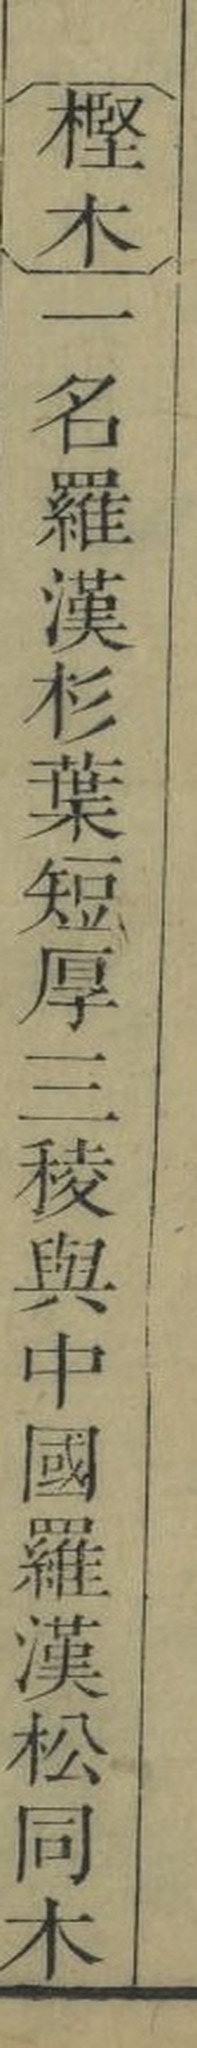[樫木]一名羅漢杉葉短厚三稜与中国羅漢松同木
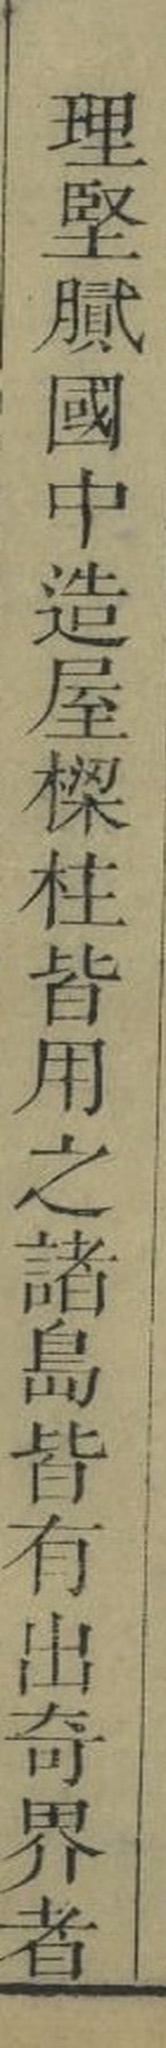理堅膩国中造屋樑柱皆用之諸島皆有出奇界者
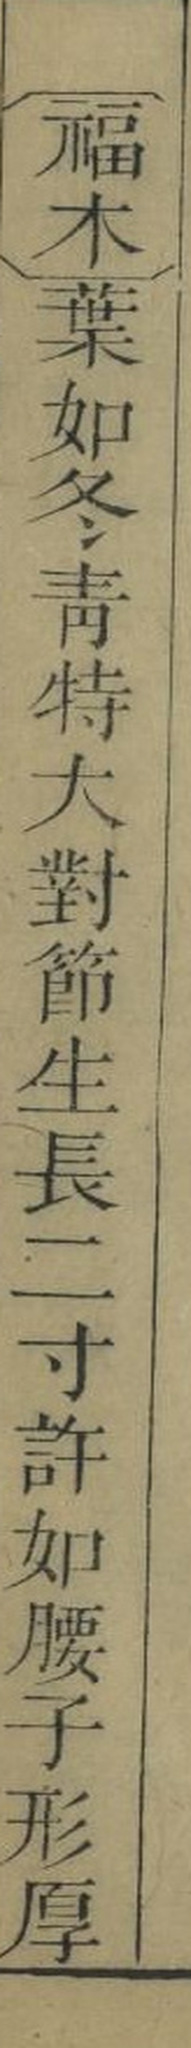[福木]葉如冬青特大対節生長二寸許如腰子形厚

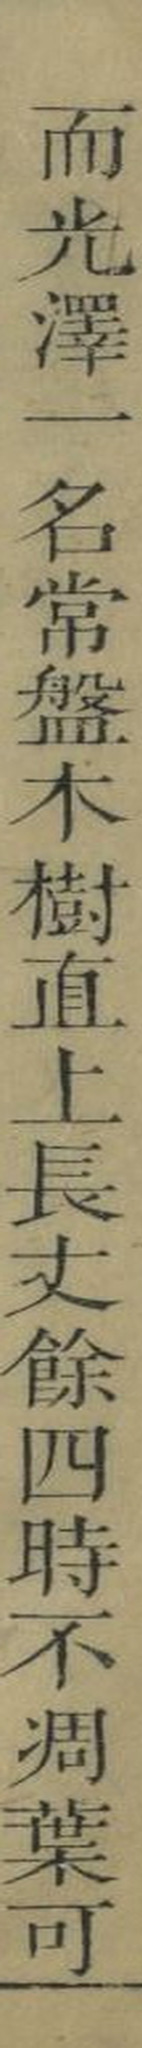而光沢一名常盤木樹直上長丈余四時不凋葉可
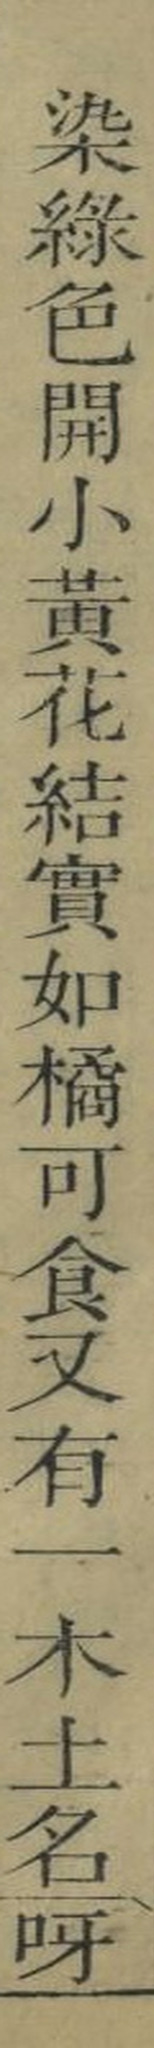染緑色開小黄花結実如橘可食又有一木土名[呀
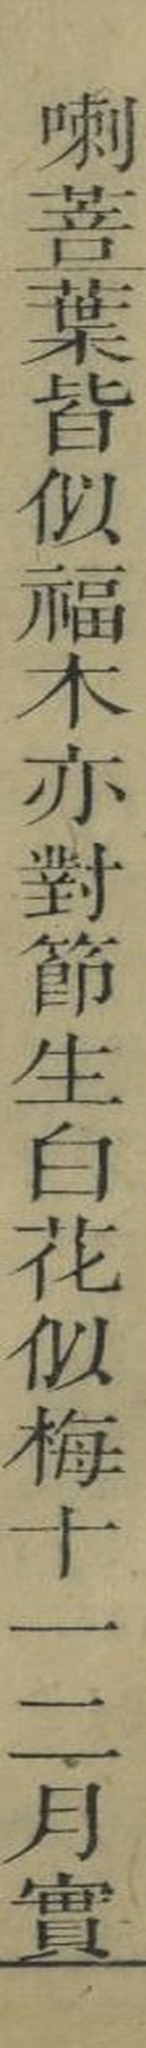喇菩]葉皆似福木亦対節生白花似梅十一二月実
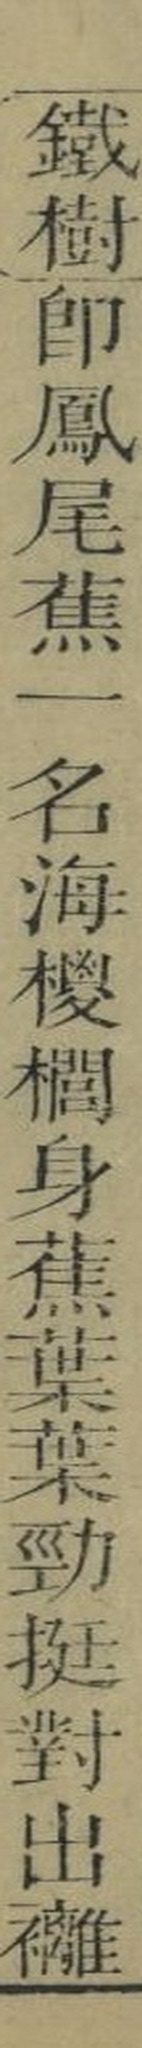[鉄樹]即鳳尾蕉一名海㯶櫚身蕉葉葉勁挺対出䙰
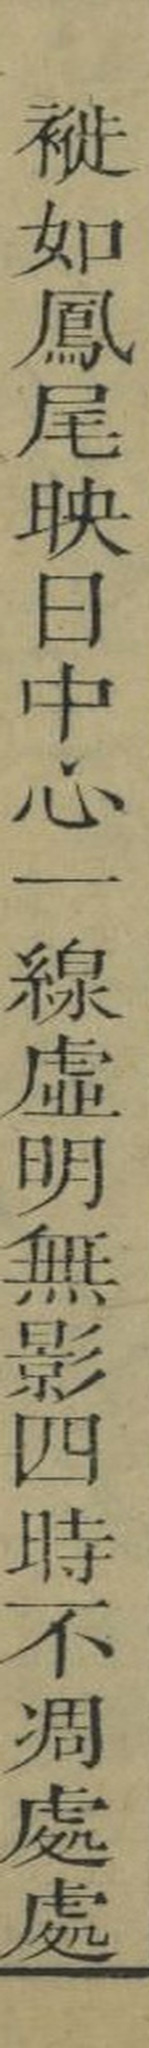褷如鳳尾映日中心一線虚明無影四時不凋処処
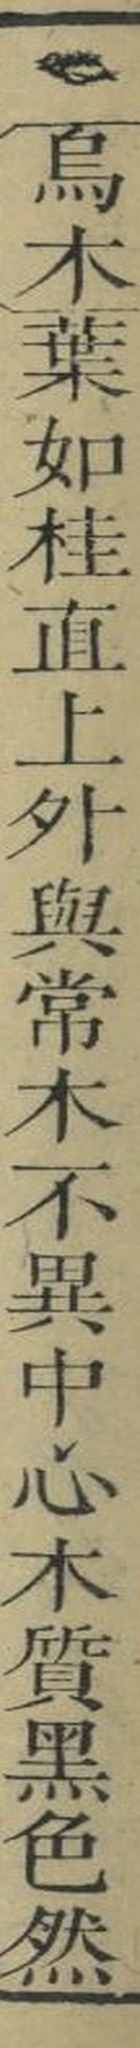[烏木]葉如桂直上外与常木不異中心木質黒色然
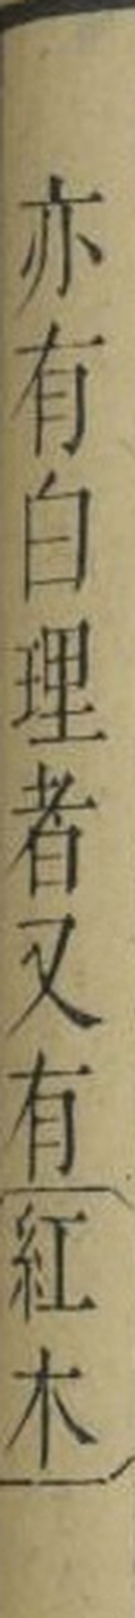亦有白理者又有[紅木]
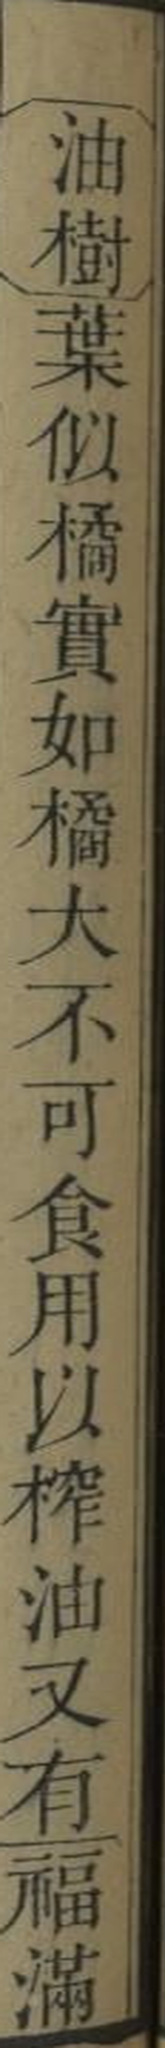[油樹]葉似橘実如橘大不可食用以榨油又有[福満
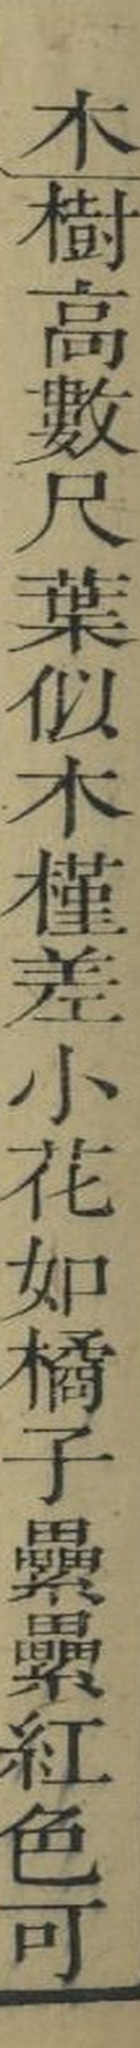木]樹高数尺葉似木槿差小花如橘子纍纍紅色可
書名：中山伝信録 巻六
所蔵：University of the Ryukyus Library
